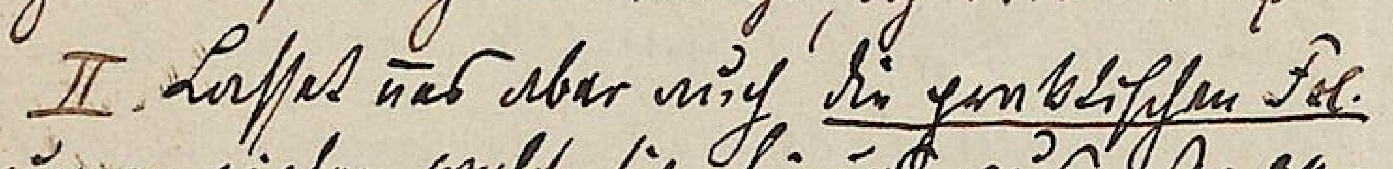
II Lasst uns aber auch die praktischen Fol¬
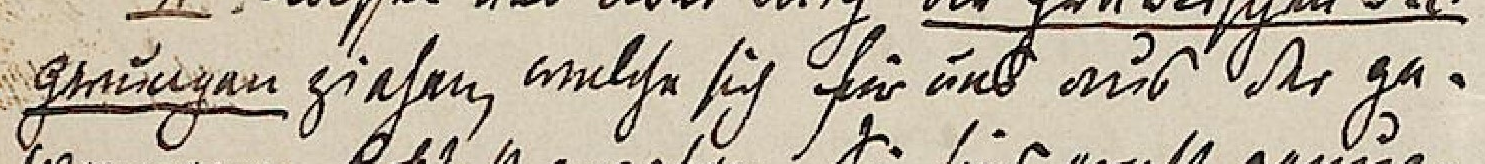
gerungen ziehen, welche sich für uns aus der ge¬
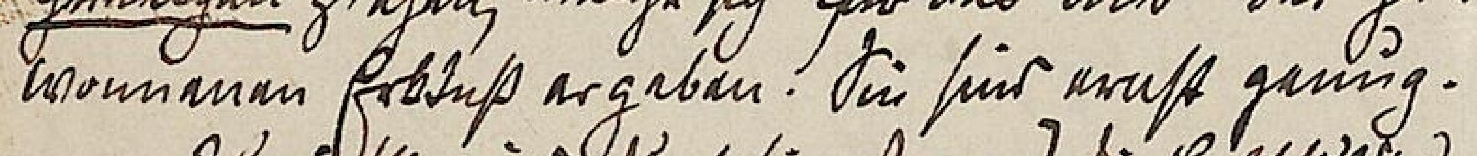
wonnenen Erktnß ergeben. Sie sind ernst genug.
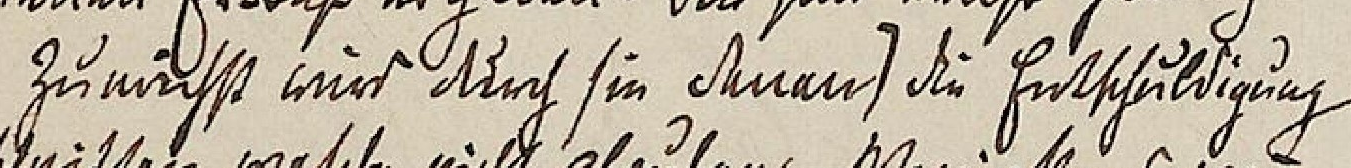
Zunächst wird durch sie denen ] die Entschuldigung
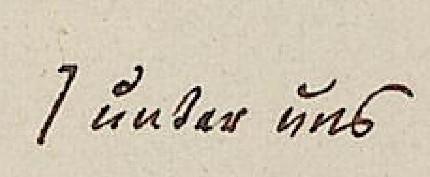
V unter uns
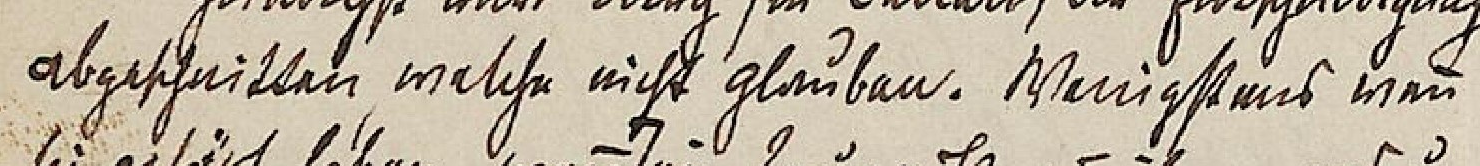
abgeschnitten, welche nicht glauben. Wenigstens wen
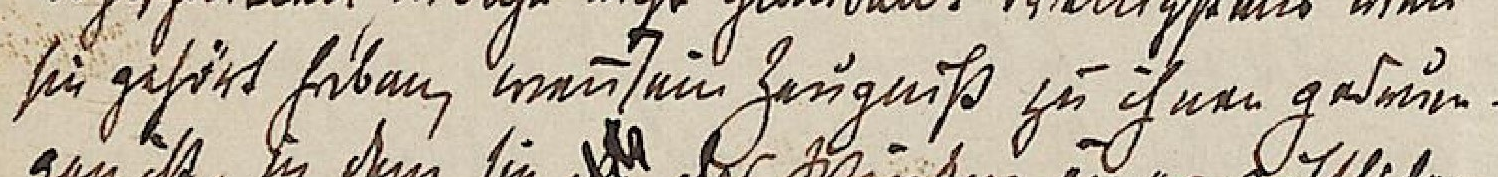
sie gehört haben, wen ] ein Zeugniß zu ihnen gedrun¬
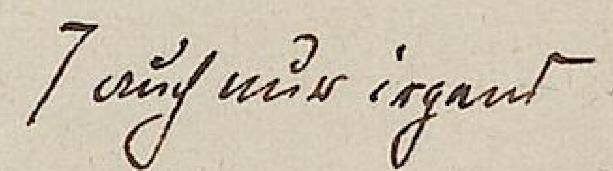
] auch nur irgend
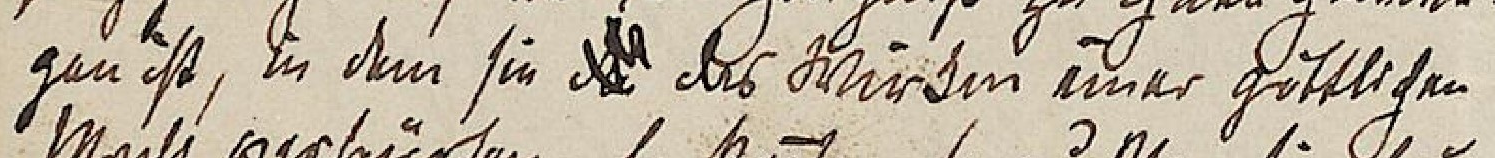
gen ist, in dem sie die das Wirken einer göttlichen
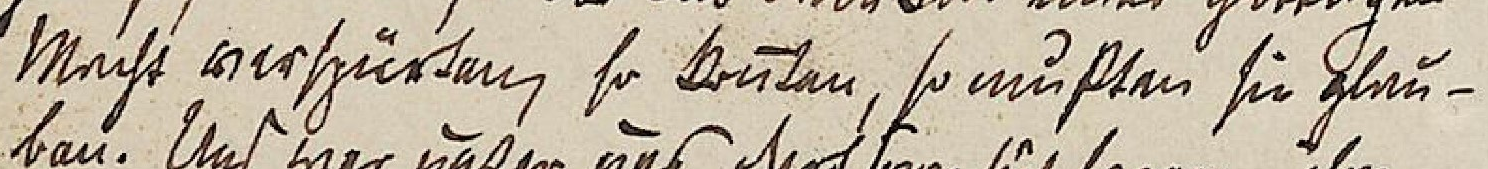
Macht verspürten, so konnten, so mußten sie glau¬
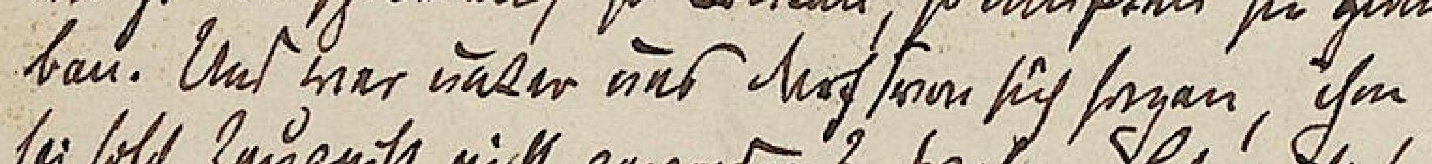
ben. Und wer unter uns darf [ von sich sagen, ihm
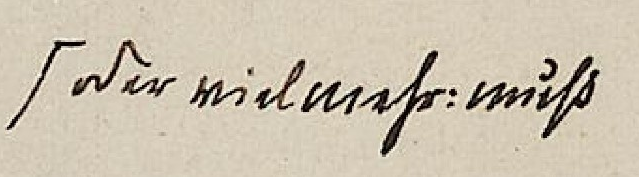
[ oder vielmehr: muß
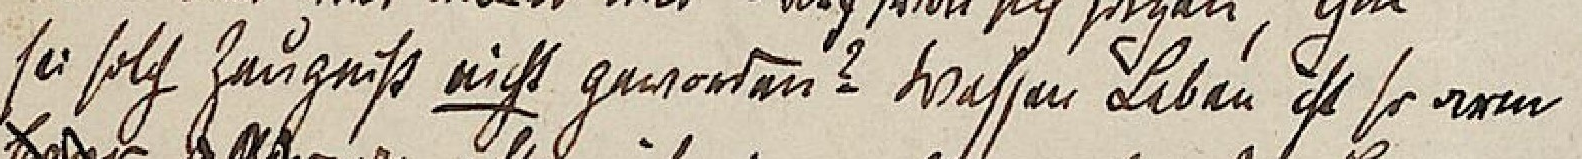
sei solch Zeugniß nicht geworden? Wessen Leben ist so arm
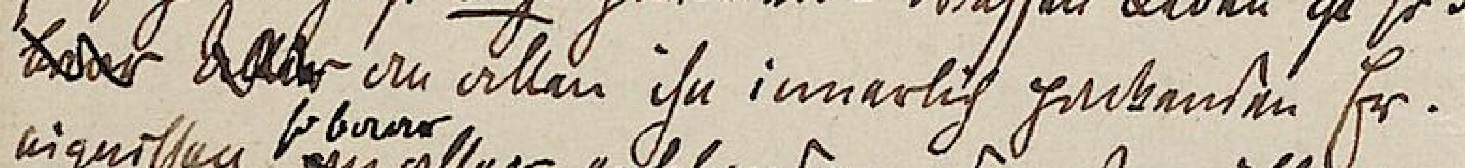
bevor allein an allen ihn innerlich packenden Er¬
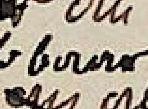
so baar
